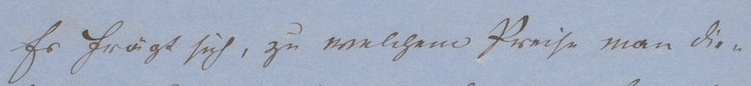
Es frägt sich, zu welchem Preise man die-
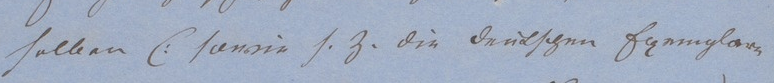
selben (: sowie s. Z. die deutschen Exemplare
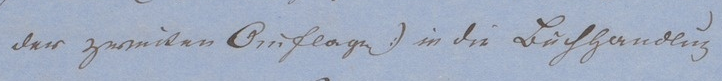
der zweiten Auflage: ) in die Buchhandlung
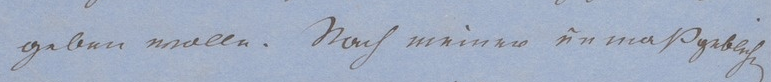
geben wolle. Nach meiner unmaßgeblichen
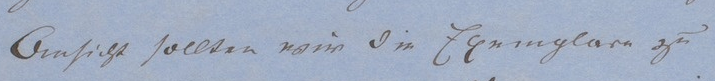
Ansicht sollten wir die Exemplare zu
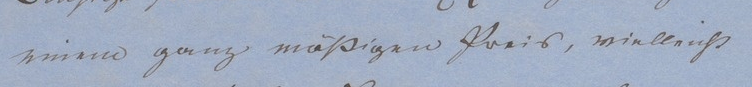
einem ganz mäßigen Preis, vielleicht
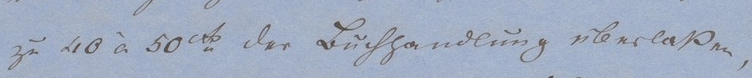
zu 40 à 50 cts der Buchhandlung überlaßen,
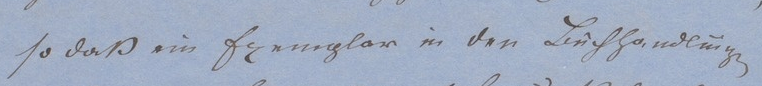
so daß ein Exemplar in den Buchhandlungen
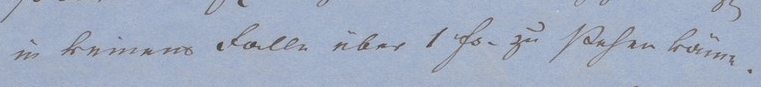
in keinem Falle über 1 fs. zu stehen käme.
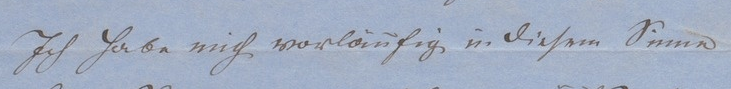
Ich habe mich vorläufig in diesem Sinne
